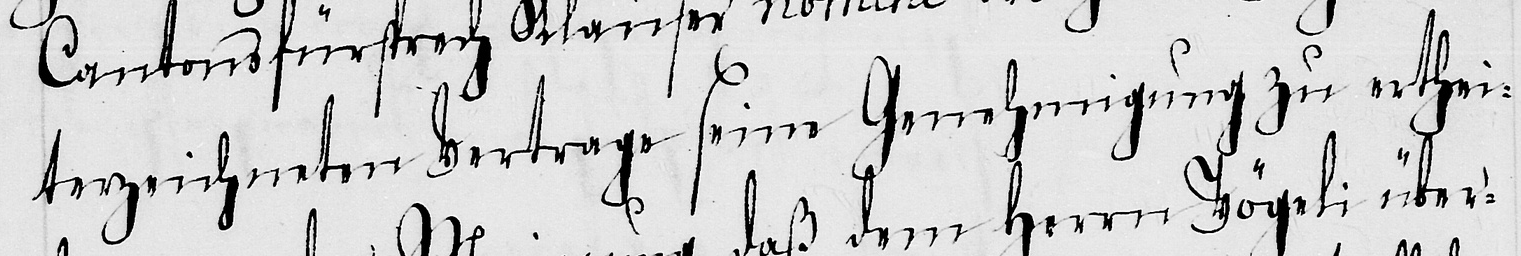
terzeichneten Vertrage seine Genehmigung zu erthei¬
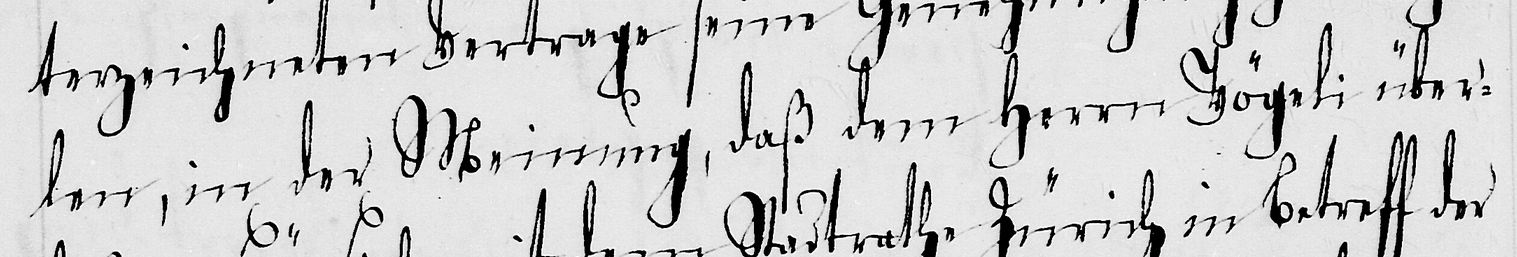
len, in der Meinung, daß dem Herrn Vögeli über¬
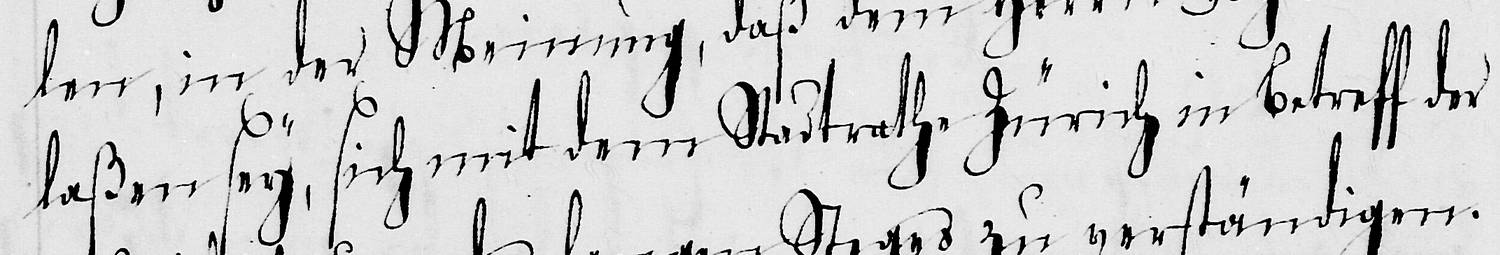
laßen sey, sich mit dem Stadtrathe Zürich in Betreff d¬
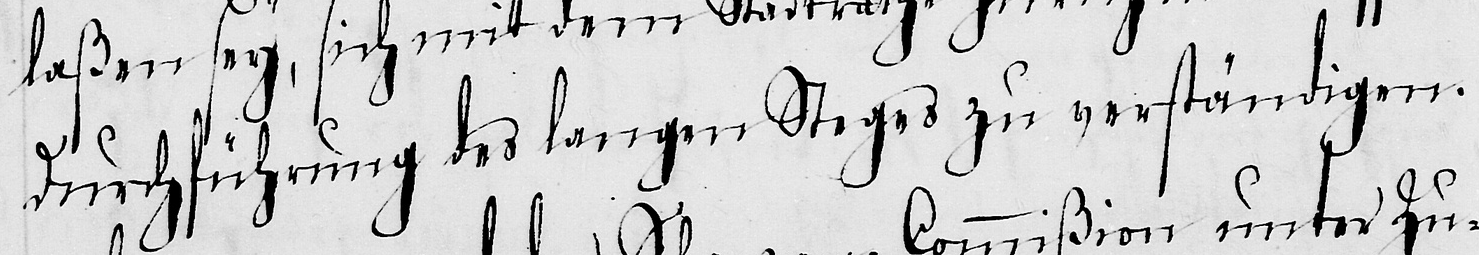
Durchführung des langen Steges zu verständigen.
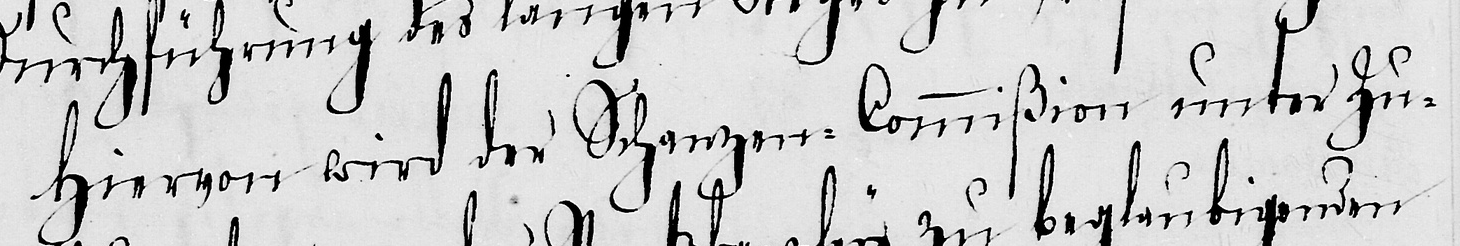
Hiervon wird der Schanzen-Commißion unter Zus¬
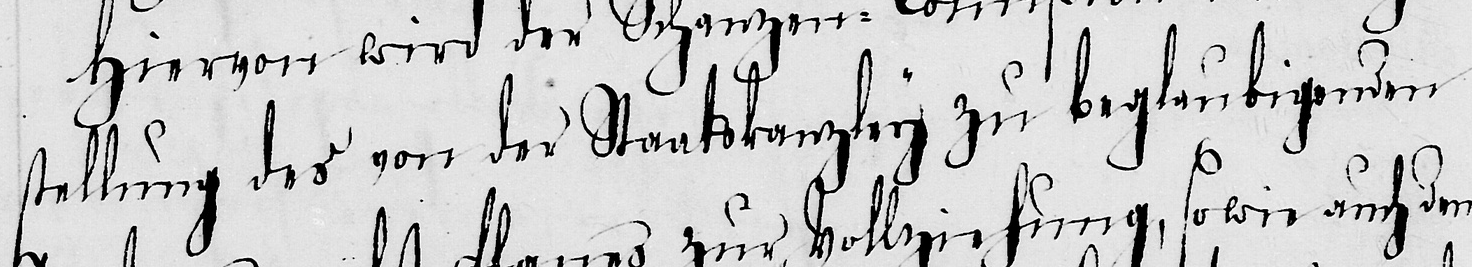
tellung des von der Staatskanzley zu beglaubigenden
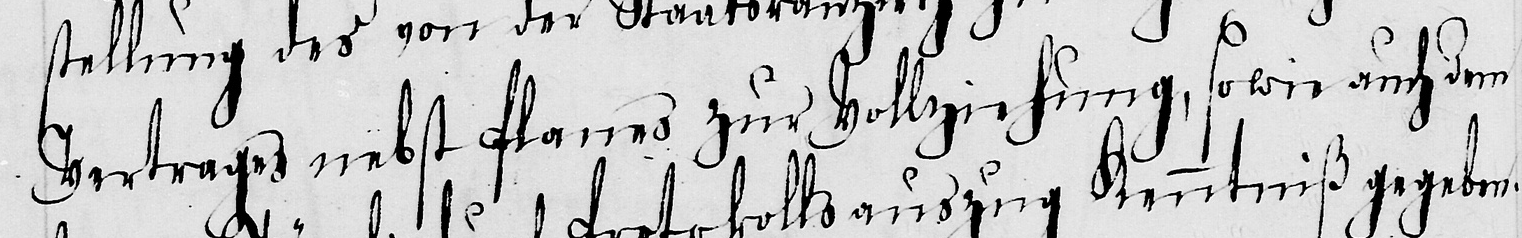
Vertrages nebst Planes zur Vollziehung, sowie auch dem
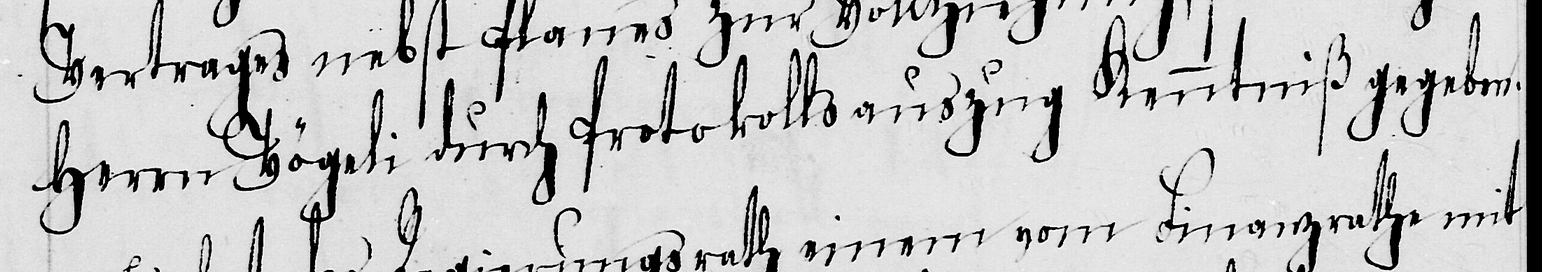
Herrn Vögeli durch Protokollsauszug Kenntniß gegebe¬
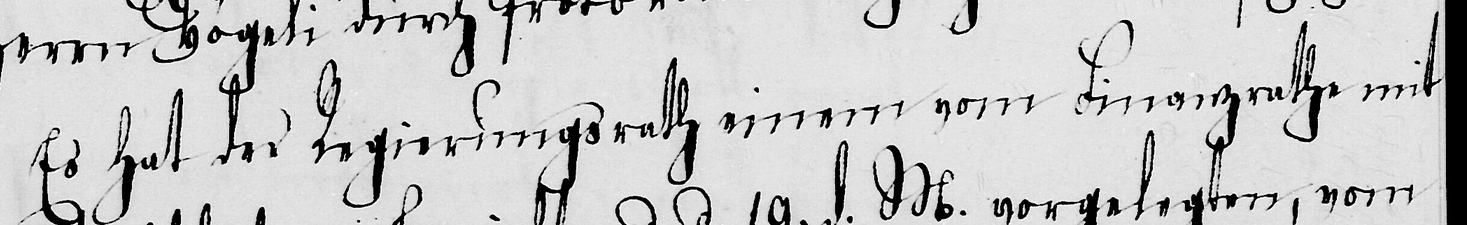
Es hat der Regierungsrath einen vom Finanzrathe mit
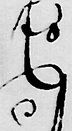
n.
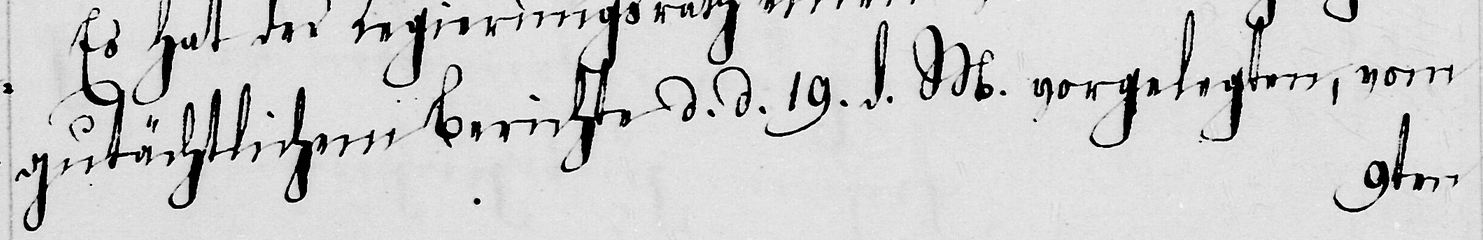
gutächtlichen Berichte d.d. 19. d. M. vorgelegten, vom
